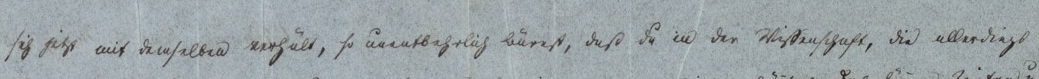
sich jetzt mit demselben verhält, so unentbehrlich wärest, daß Du in der Wissenschaft, die allerdings
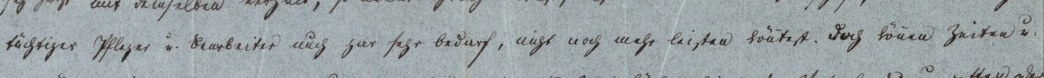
tüchtiger Pfleger u. Bearbeiter auch gar sehr bedarf, nicht noch mehr leisten könntest. Doch können Zeiten u.
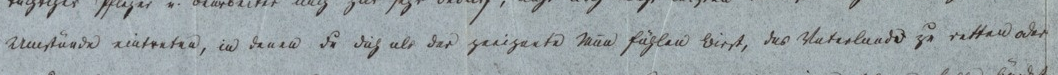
Umstände eintreten, in denen Du Dich als der geeignete Mann fühlen wirst, das Vaterlande zu retten oder
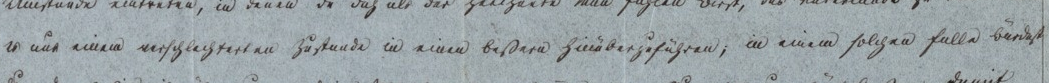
es aus einem verschlechterten Zustande in einen bessern hinüberzuführen; in einem solchen Falle würdest
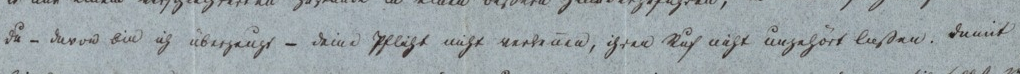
Du – davon bin ich überzeugt – Deine Pflicht nicht verkennen, ihren Ruf nicht ungehört lassen. Damit
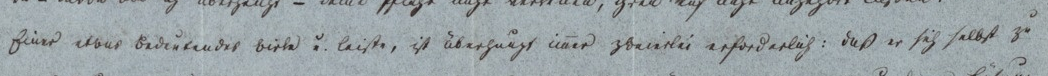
Einer etwas Bedeutendes wirke u. leiste, ist überhaupt immer zweierlei erforderlich: daß er sich selbst zu
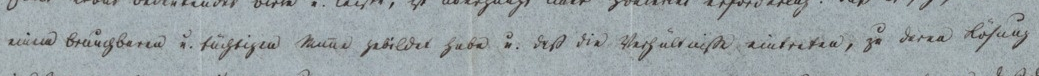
einem brauchbaren u. tüchtigen Manne gebildet habe u. daß die Verhältnisse eintreten, zu deren Lösung
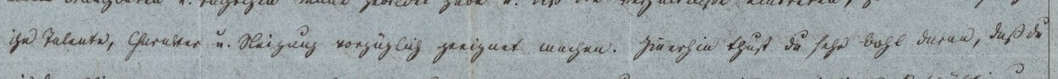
ihn Talente, Charakter u. Neigung vorzüglich geeignet machen. Immerhin thust Du sehr wohl daran, daß Du
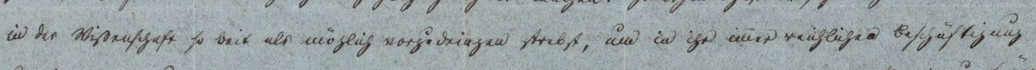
in der Wissenschaft so weit als möglich vorzudringen strebst, um in ihr immer reichlichen Beschäftigung
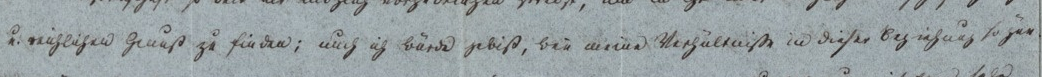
u. reichlichen Genuß zu finden; auch ich würde gewiß, wenn meine Verhältnisse in dieser Beziehung so gün-
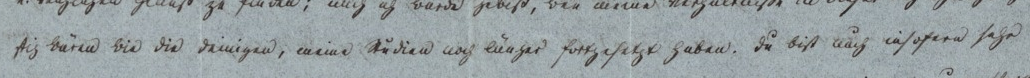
stig wären wie die Deinigen, meine Studien noch länger fortgesetzt haben. Du bist auch insofern sehr
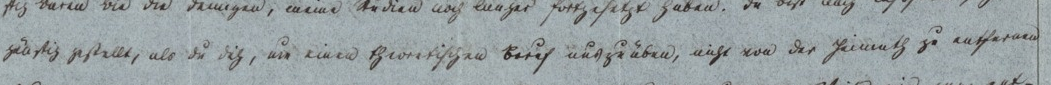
günstig gestellt, als Du Dich, um einen theoretischen Beruf auszuüben, nicht von der Heimath zu entfernen
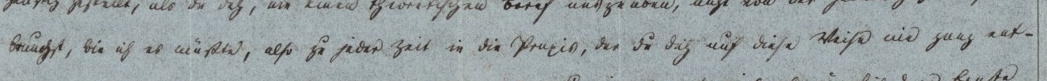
brauchst, wie ich es müßte, also zu jeder Zeit in die Praxis, der Du Dich auf diese Weise nie ganz ent-
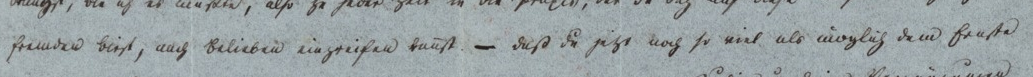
fremden wirst, nach Belieben eingreifen kannst. – Daß Du jetzt noch so viel als möglich dem Ernste
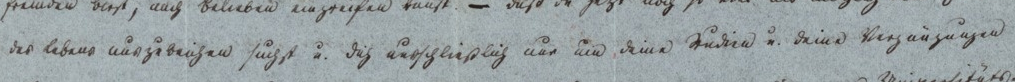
des Lebens auszuweichen suchst u. Dich ausschließlich nur um Deine Studien u. Deine Vergnügungen
